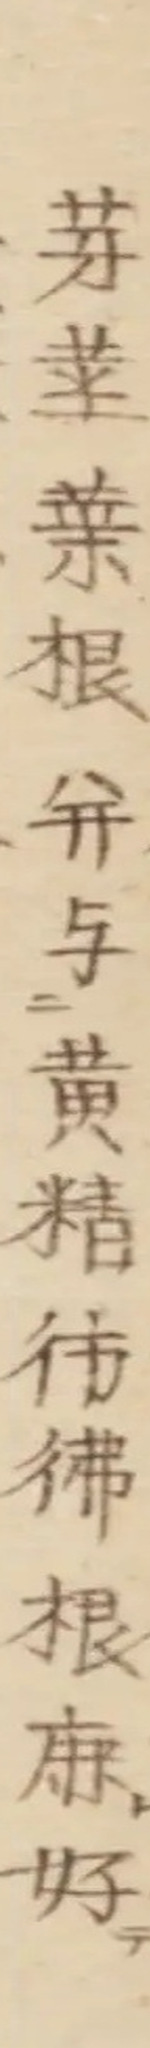芽莖葉根弁与黄精彷彿根鹿好テ
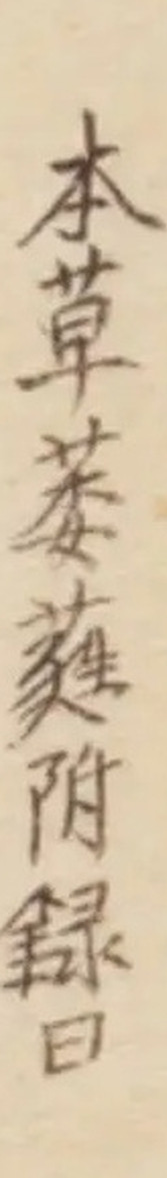本草萎甤附録曰
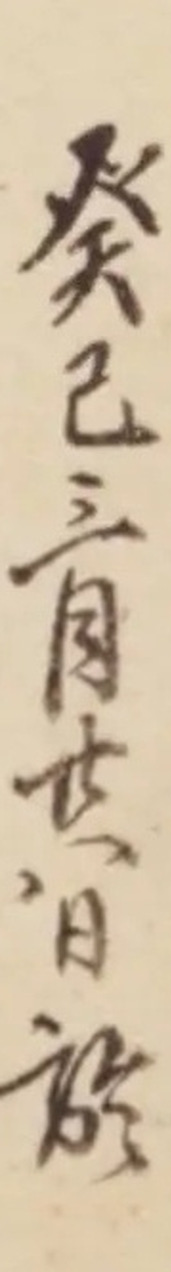癸巳三月廿八日於
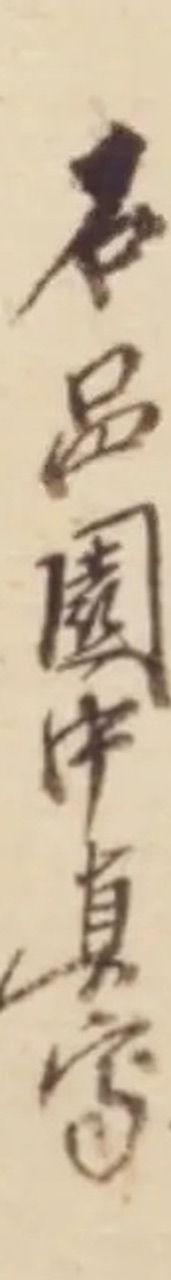石品園中真寫
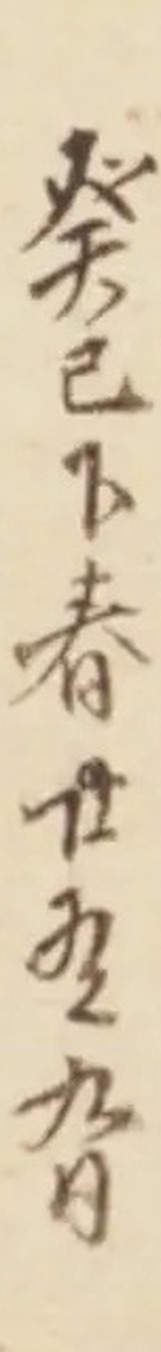癸巳下春廿有九日
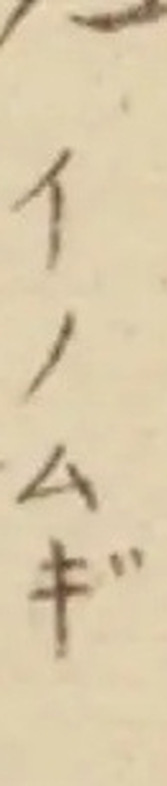イノムギ
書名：梅園草木花譜春之部. 4
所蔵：国立国会図書館 National Diet Library, JAPAN
